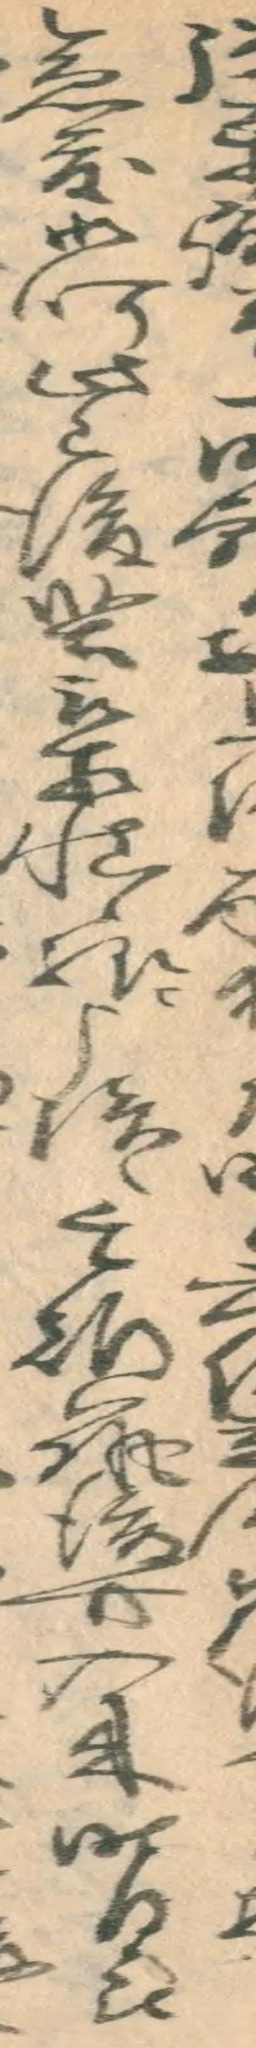急度御呵此已後堅被相慎候様ニ申談候今朝筑後介入来昨日被
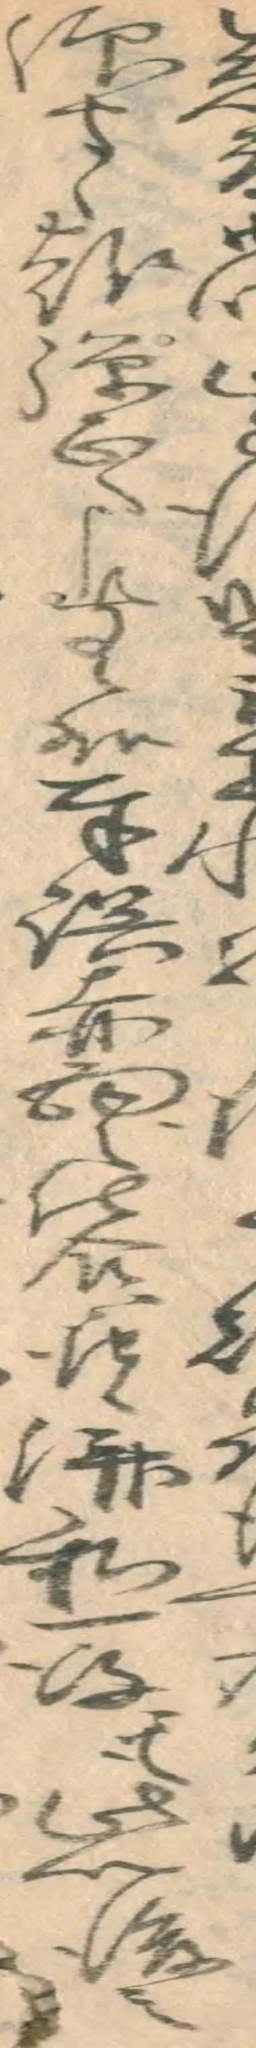仰聞候趣弾正へ申聞候処奉誤赤面之仕合御座候併私一存ニも此以後之
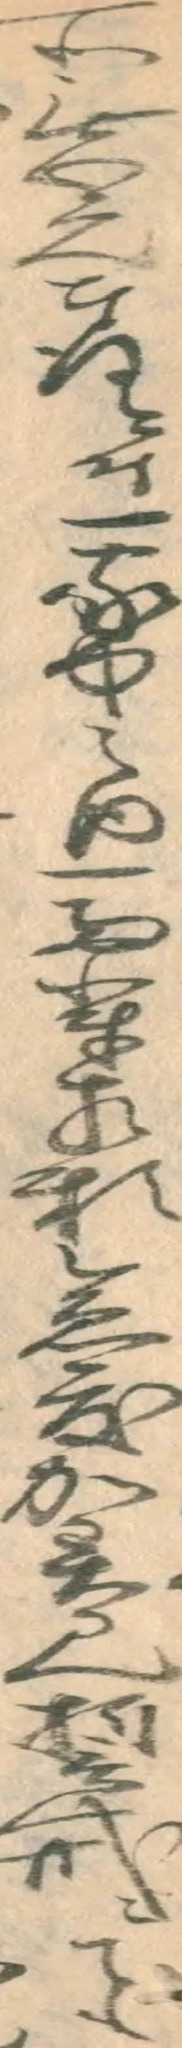所無心元奉存ニ付一家中之内一両輩相頼急度加異見誓戒ニても
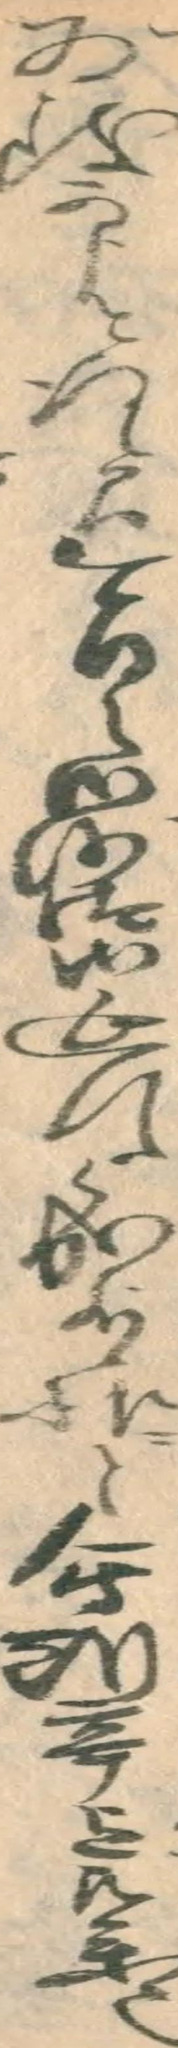為致可申と存候間今日之御沙汰御延引被成被下候様ニと会所亭迄被参也
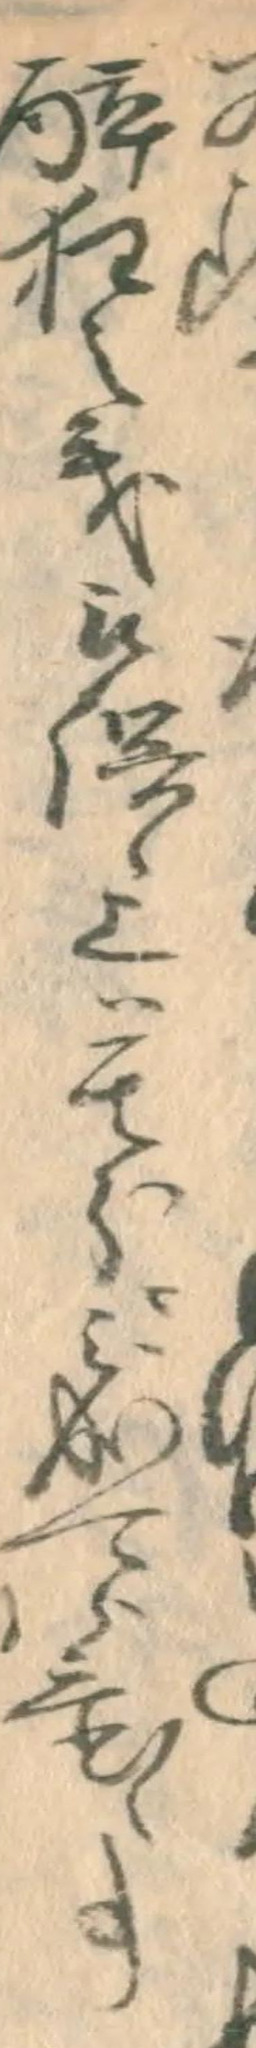酔狂之義被誤候上ハ其分ニ被成可被置候事
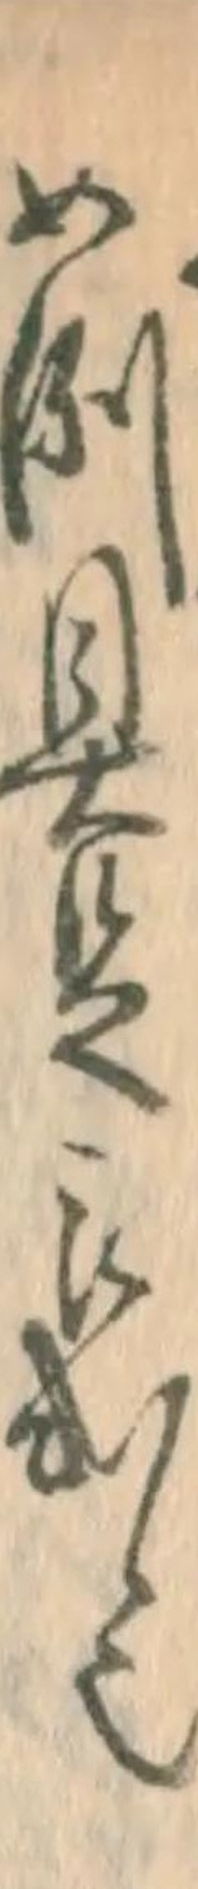如例具足被出候也
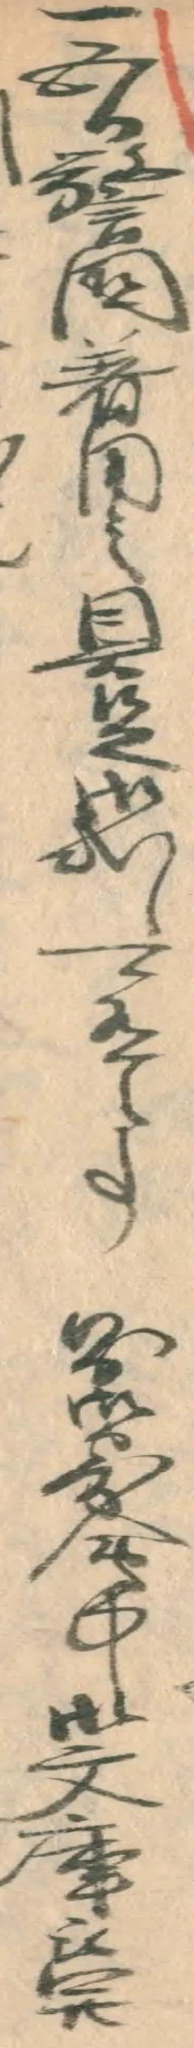一五日警固着用之具足御出し可有之事則御寄会中御文庫被開
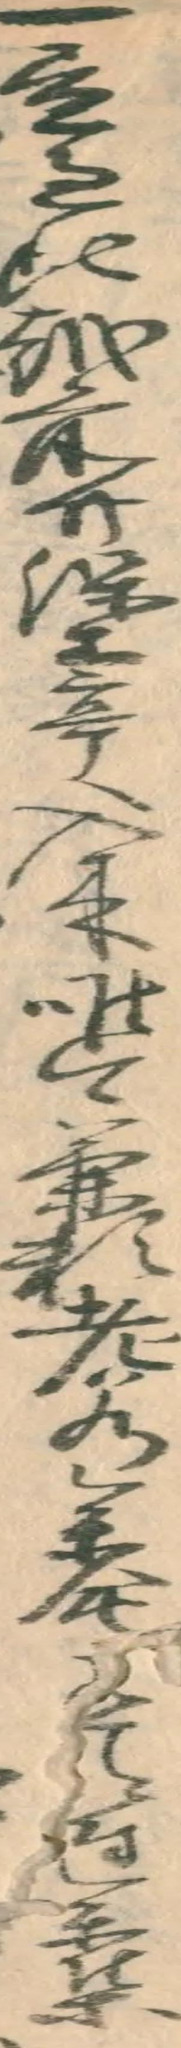一昼過比越前介保土亭へ入来唯今兼頼老若参会有之ニ付参集
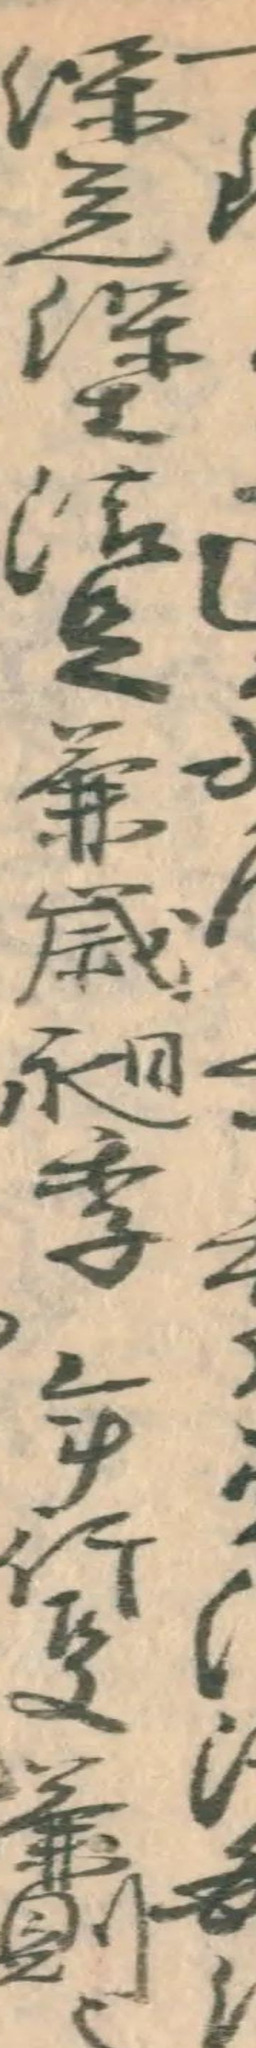保覚保土清足兼歳昶季年行事兼則也
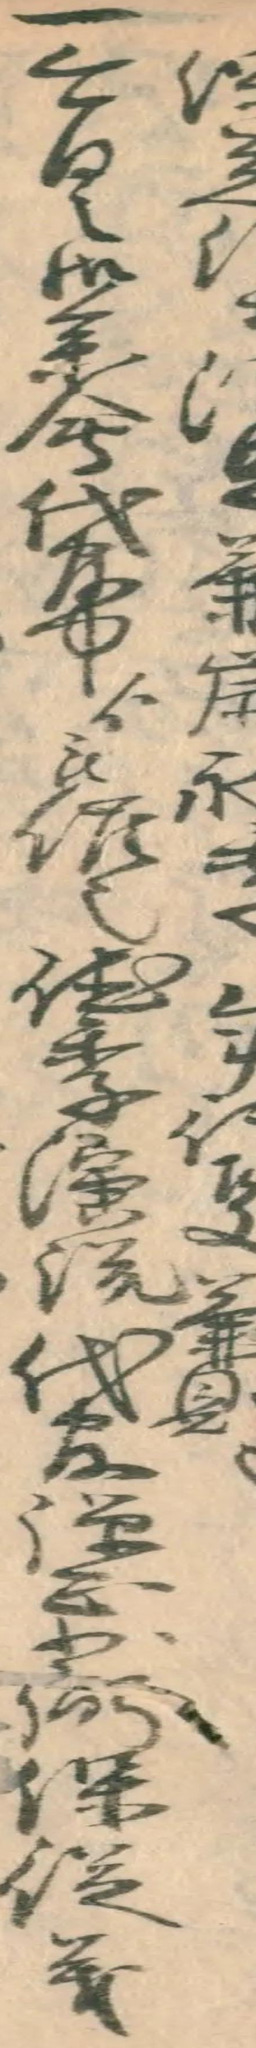一今日之御参会代官中ゟ被催也徳季演説代官弾正少弼保従義
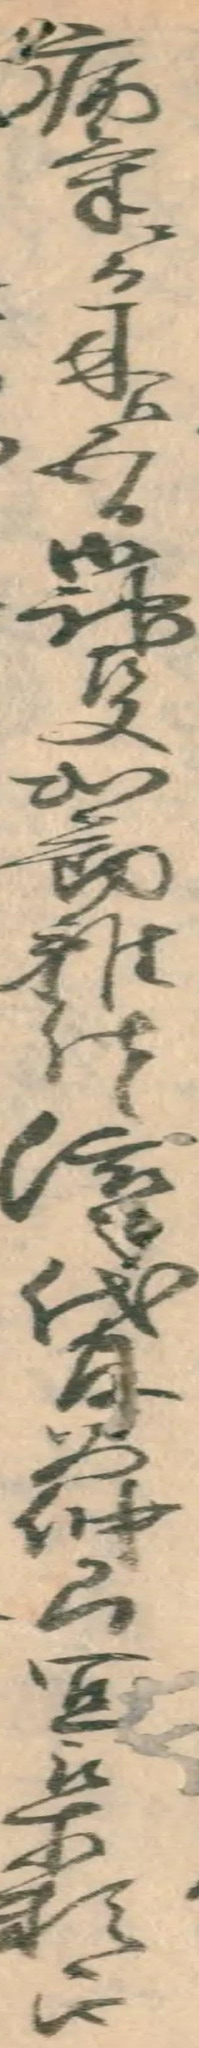病気ニ而来ル五日御神事出勤難仕候依之代官為仲間宜被相頼候由
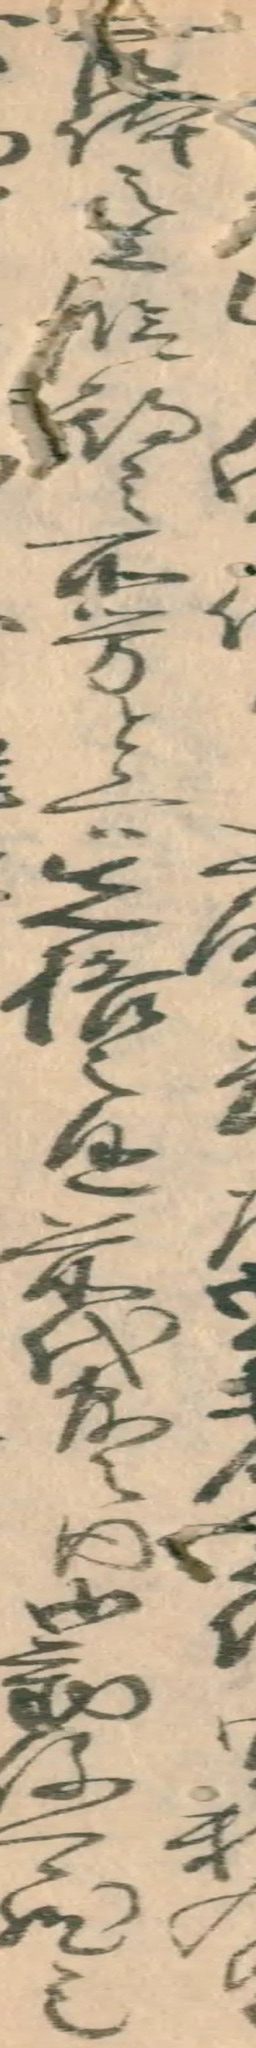許之上臨期之所労と候へハ先格之通前代官之内御勤役可然候也
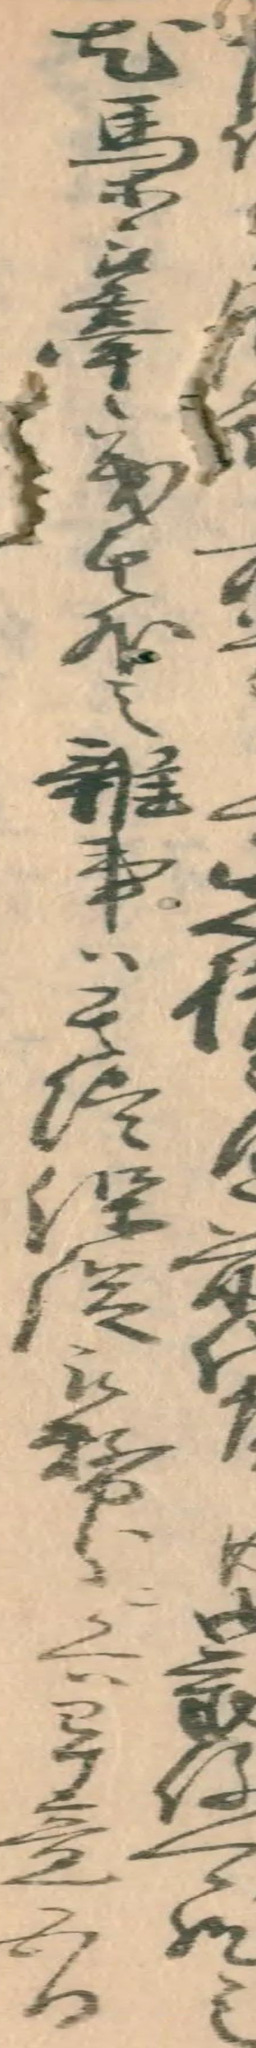尤馬等被牽候義其外之雑事ハ其儘保従被務分に候へハ畢竟五日
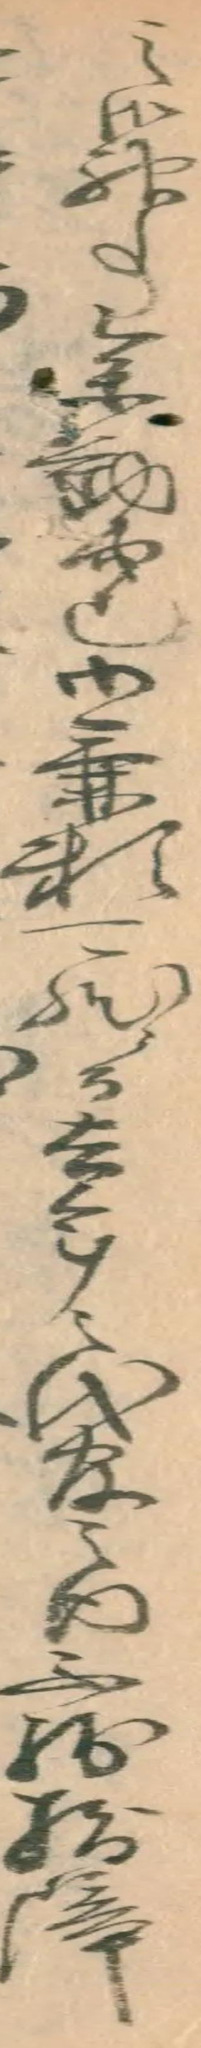之御神事参勤而巳御兼頼可然ニ而去年之代官之内不残指障
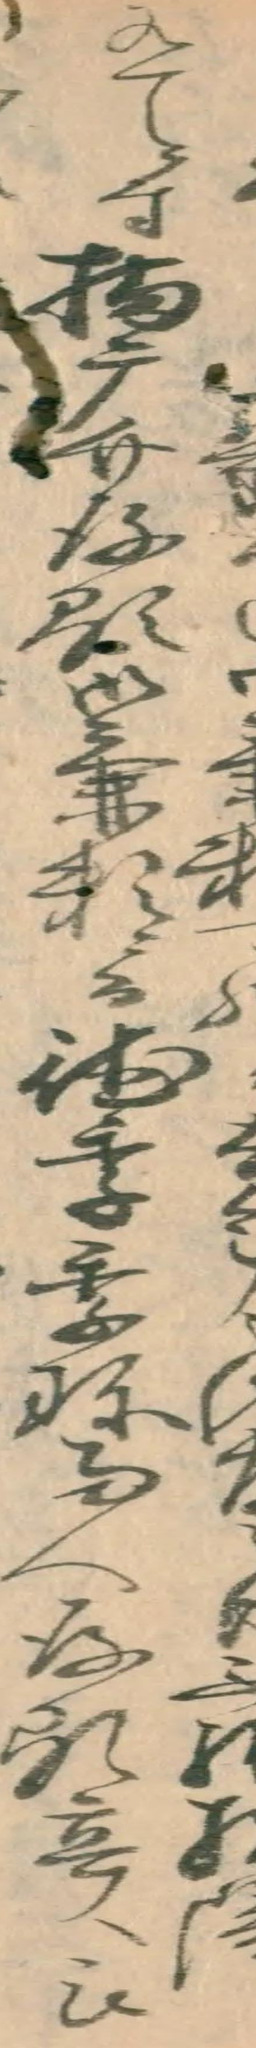有之ニ付播磨介存顕御兼頼ニ而徳季季珍両人存顕亭へ被
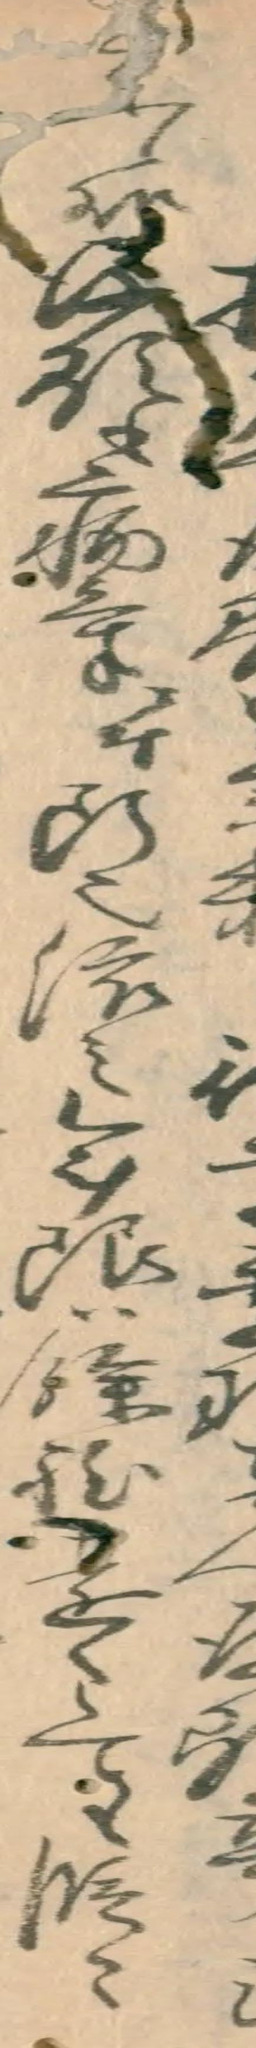参候処存顕も病気ニ付断也依之年限ハ余程遠く候ても段々
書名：賀茂社記録. 第58冊
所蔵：国立国会図書館 National Diet Library, JAPAN
